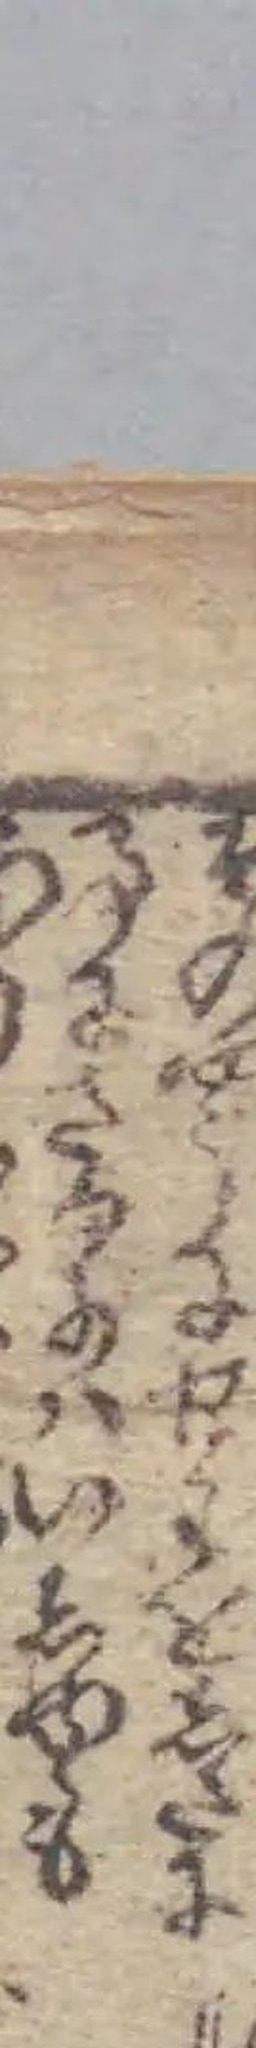事にさるにはいしゆも
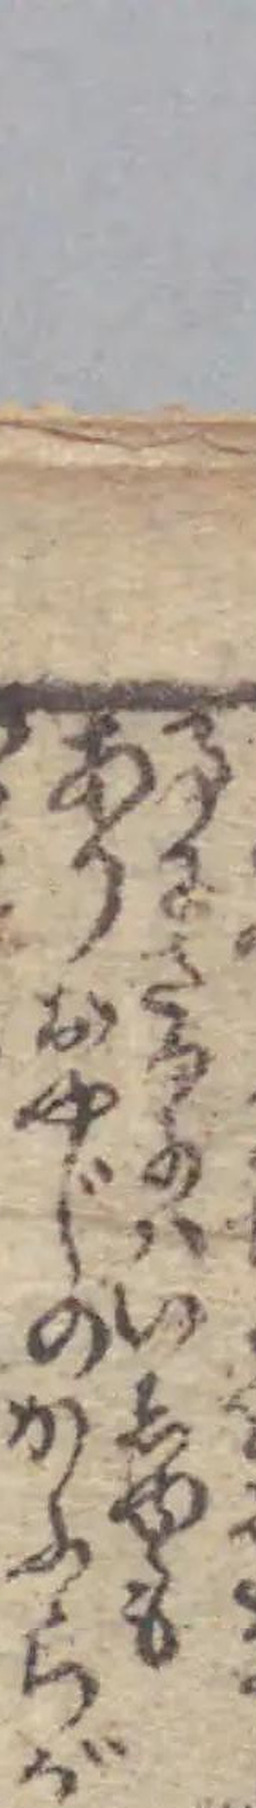ありおやじのかふらが
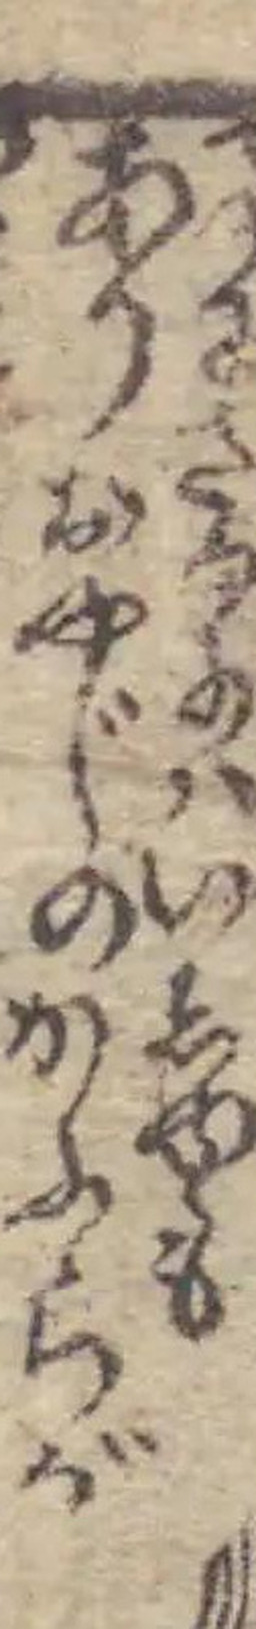ありおやじのかふらが
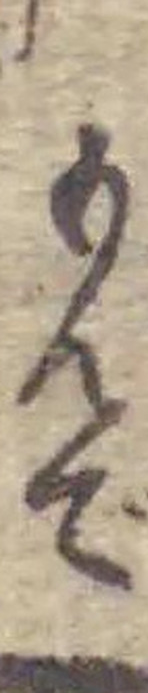もんで
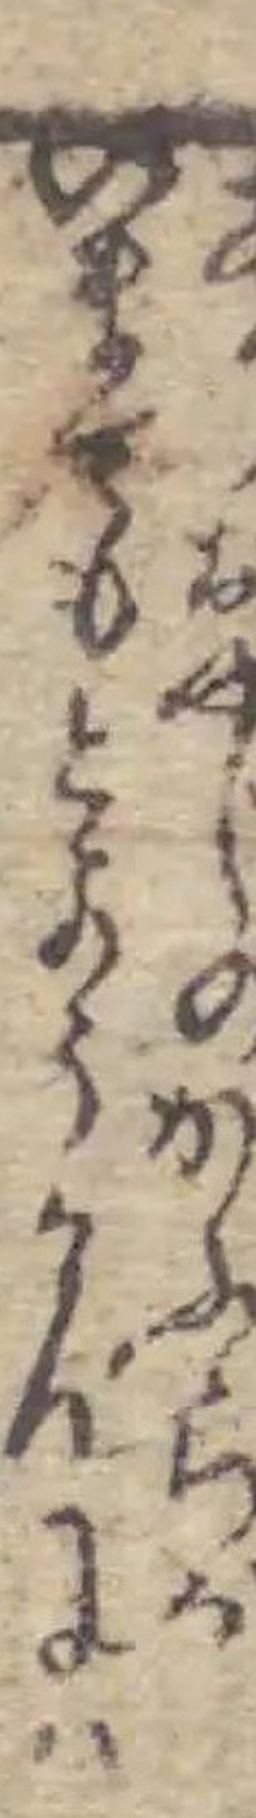いまてもとようかんには
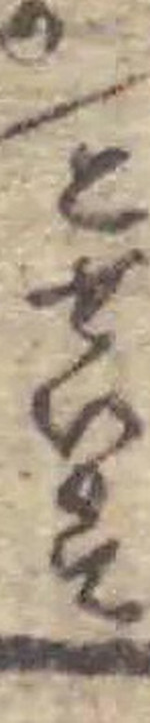こせいす
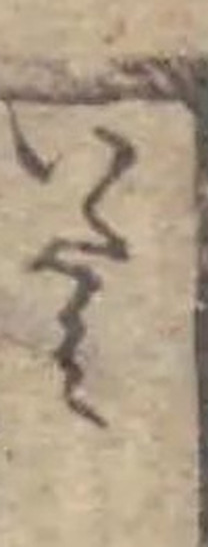いたみ
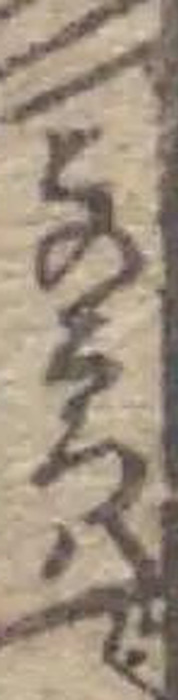このころは
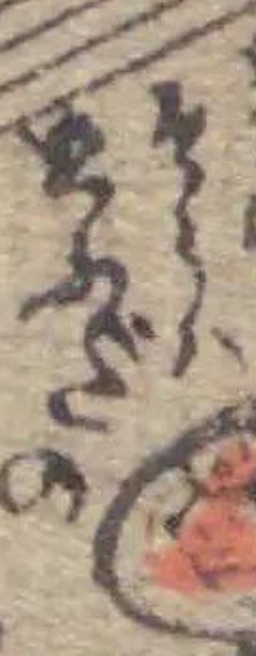とふだの
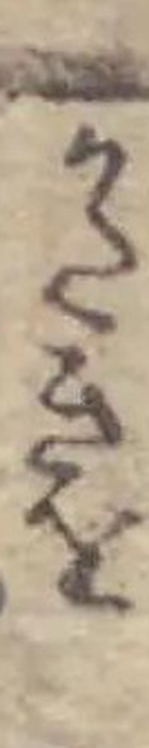かたきを
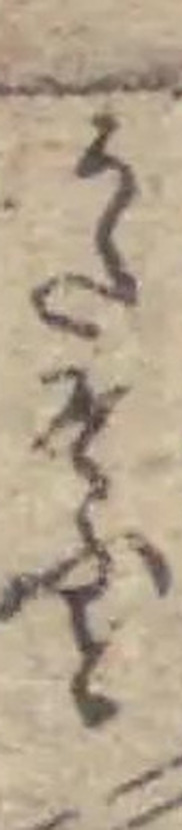うたそふと
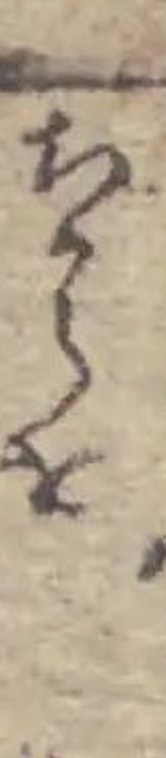ちからを
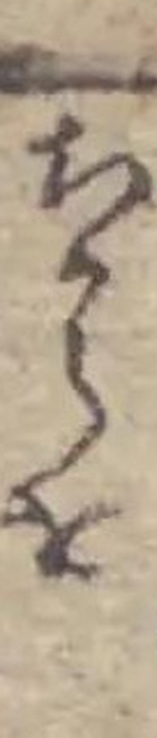ちからを
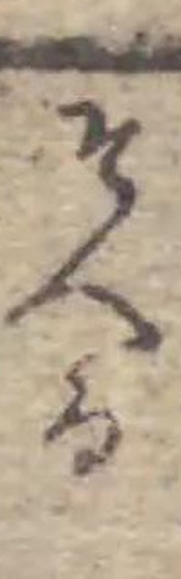そへる
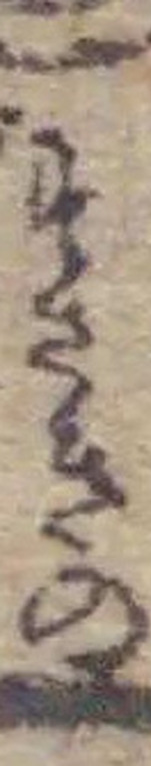すさきの
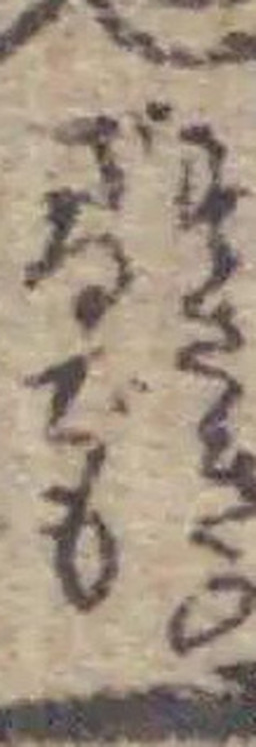ざるでも
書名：蟹牛房挟多 3巻
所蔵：国立国会図書館 National Diet Library, JAPAN
